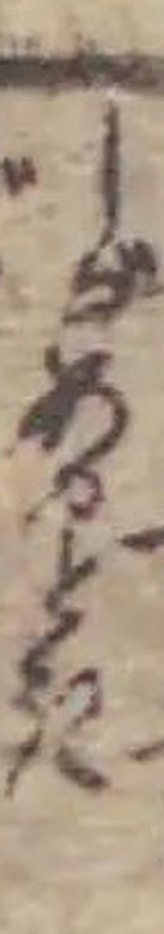しがあるとき
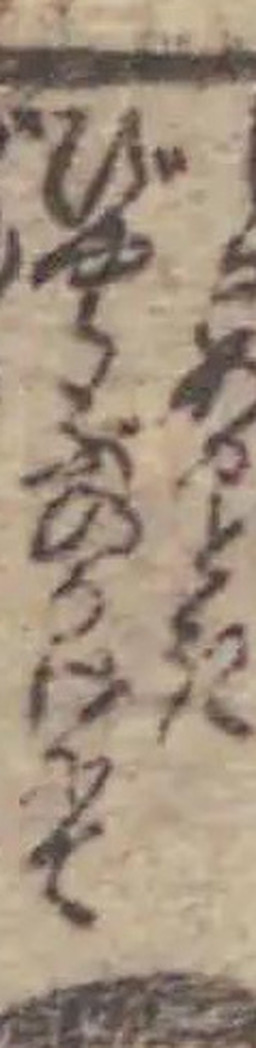びやうぶのかけにて
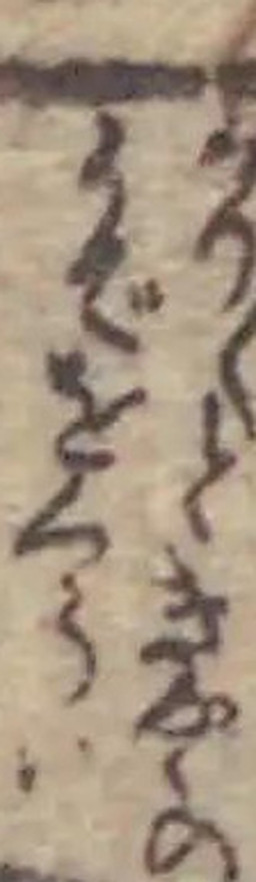うでをくらい
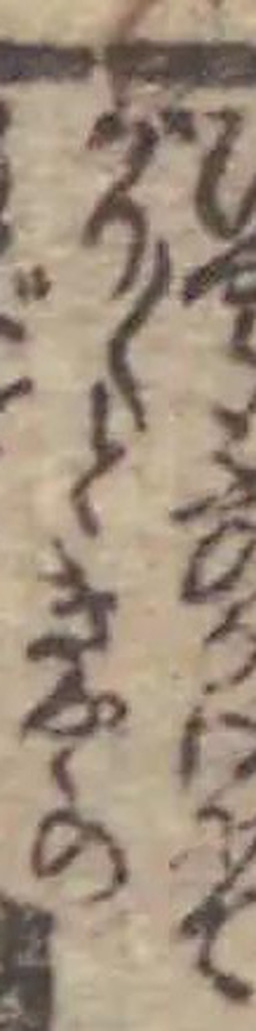がり〳〵ときやくの
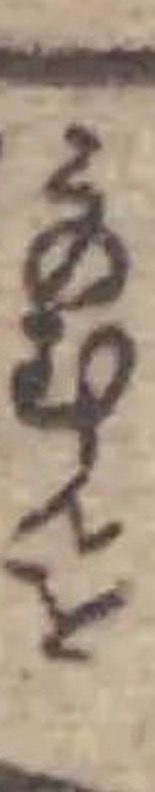このむしんを
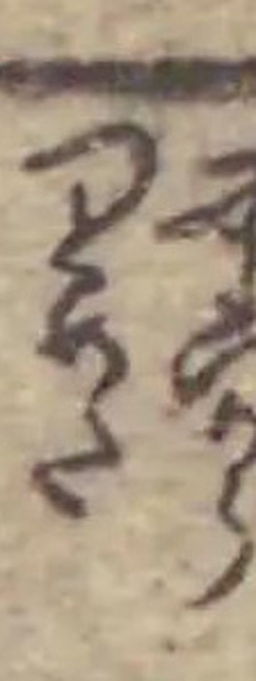つとめた
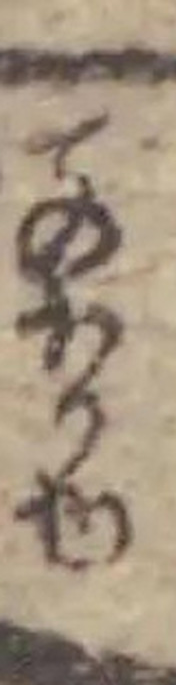てのほり物
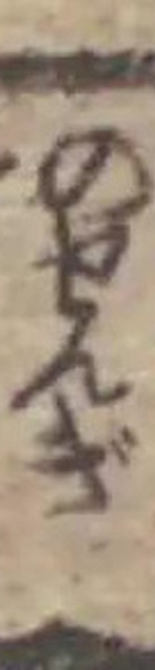のせんぎ
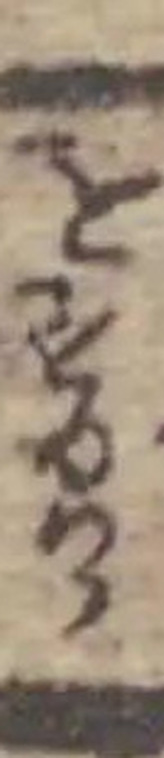をするから
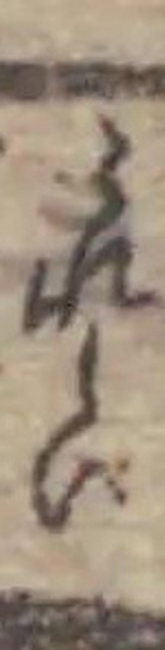うれしい
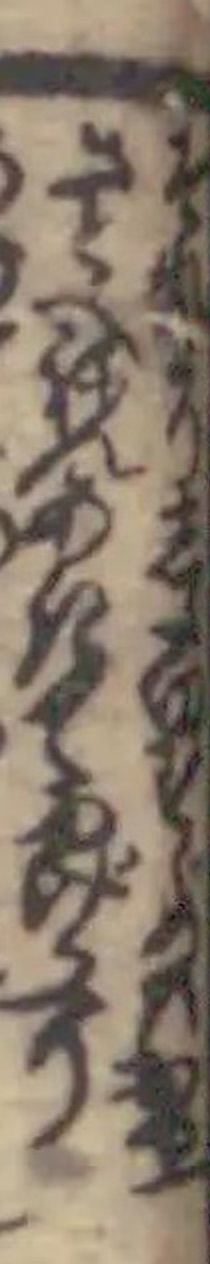さとへねんあきてあげかへり
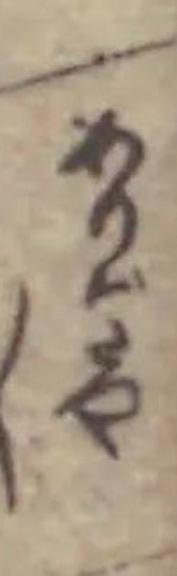ありがたや
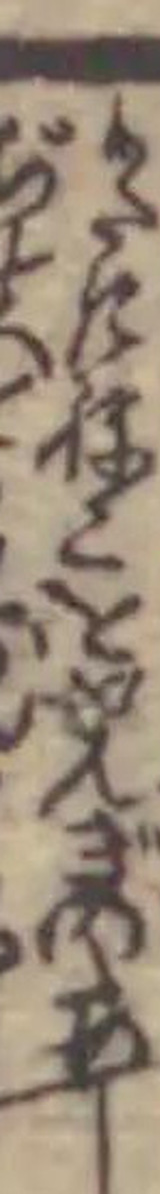かたきねこをせんぎのため
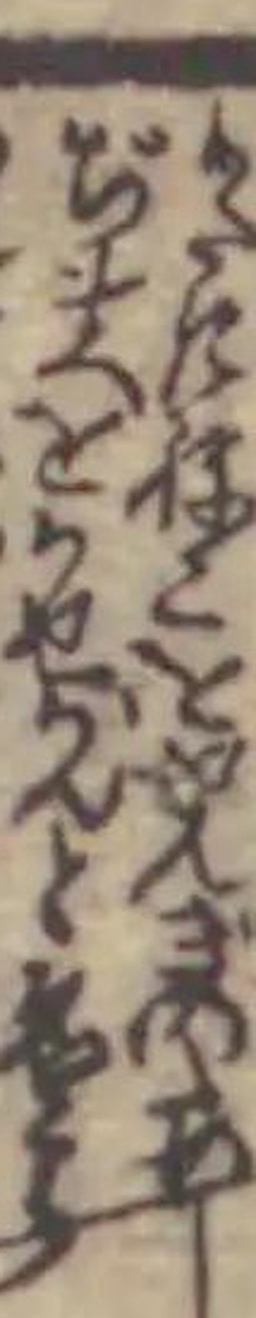ぢまへをかせがんとゑこう
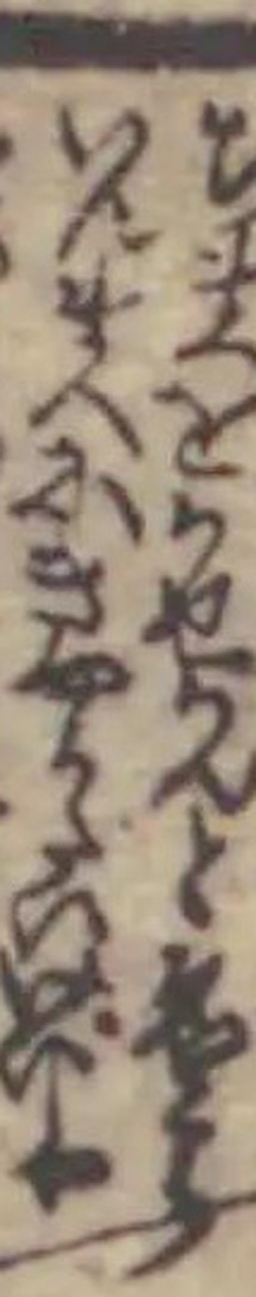いんまへにきやうたいげいしや
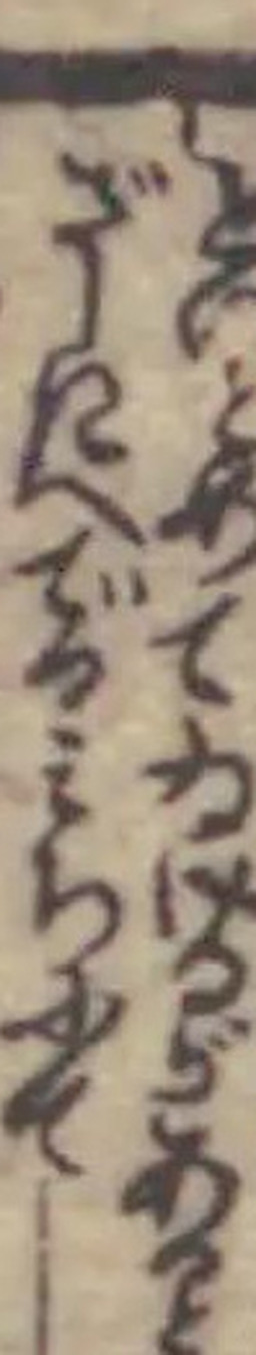ざしきへでるみちにて
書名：冷水灰毛猫 2巻
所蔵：国立国会図書館 National Diet Library, JAPAN
